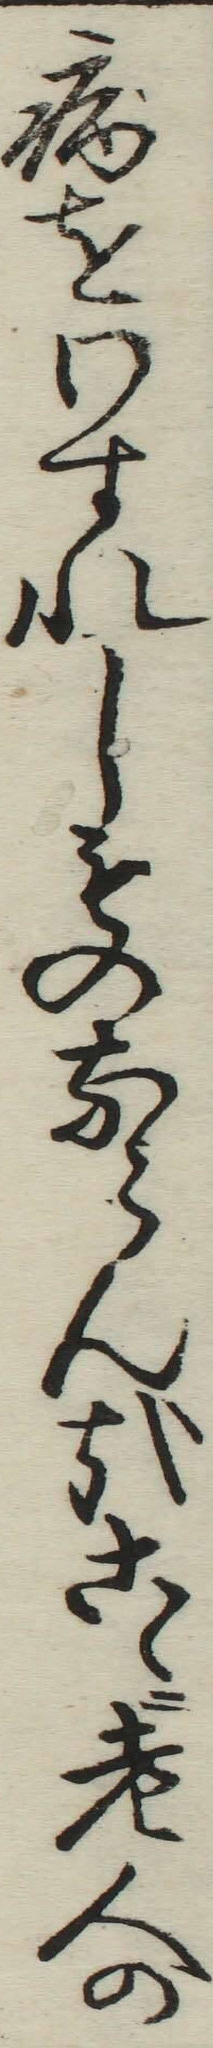病をわすれしものならん哉こゝに老人の
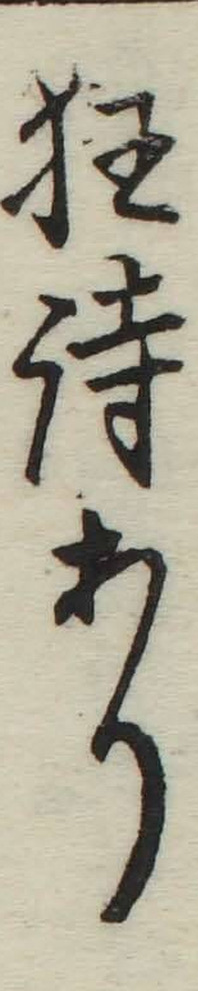狂詩あり
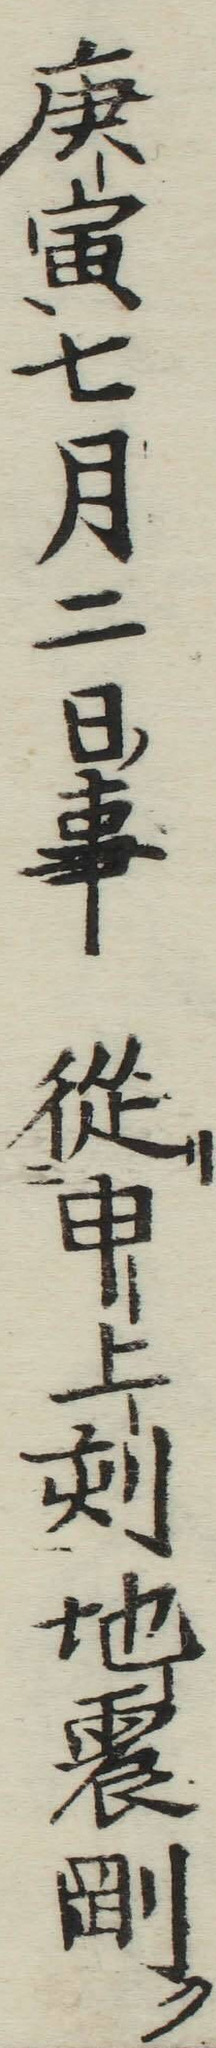庚寅七月二日事従申ー上ー刻地ー震剛
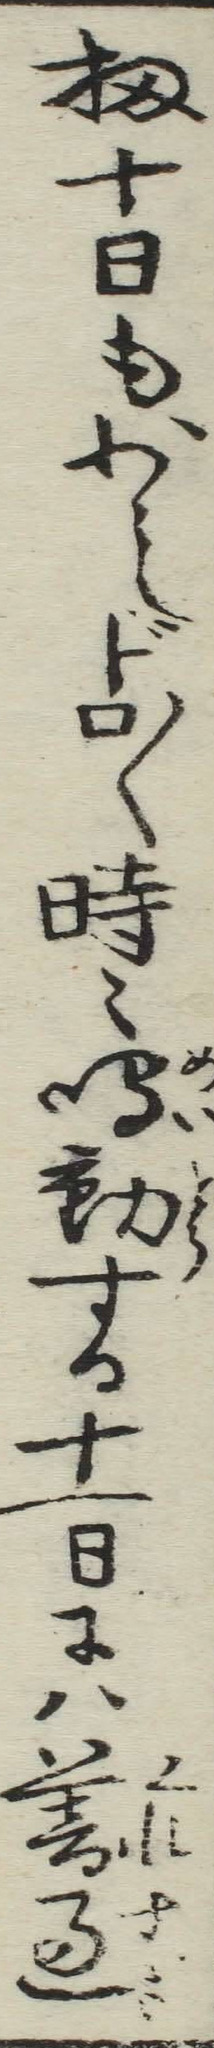扨十日も少しドロ〳〵時々鳴動する十一日には暮過
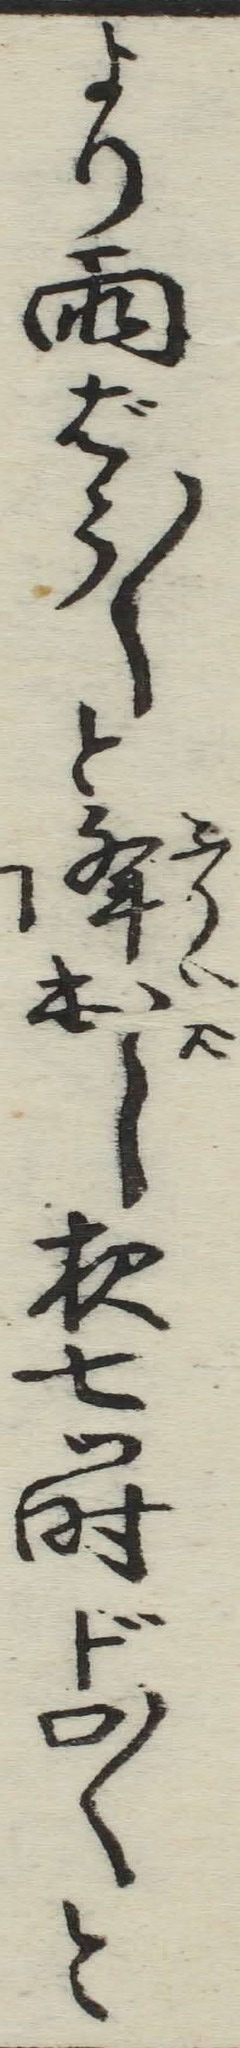より雨ばら〳〵と降出し夜七ツ時ドロ〳〵と
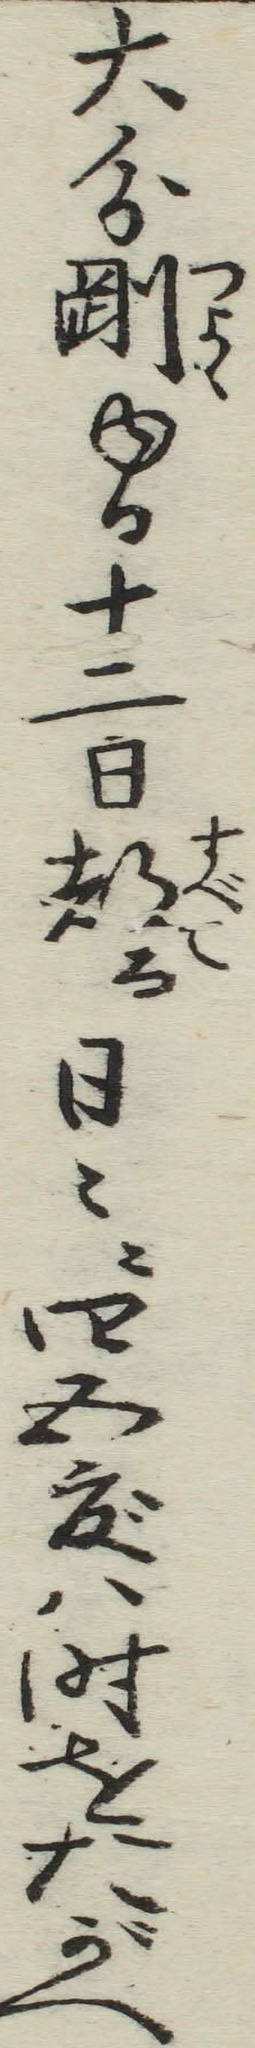大分剛ゆる十二日都而日々ニ四五度は時をたがへ
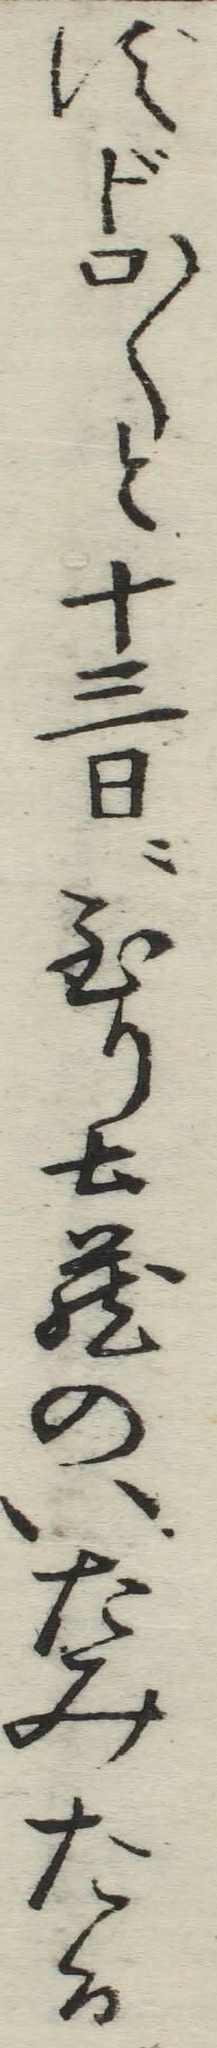ずドロ〳〵と十三日に至り土蔵のいたみたる
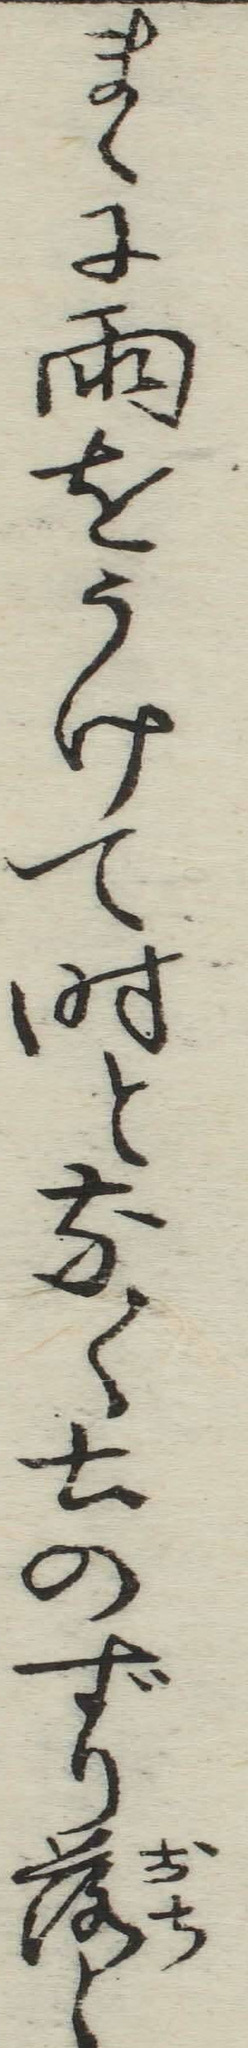まゝに雨をうけて時となく土のずり落し
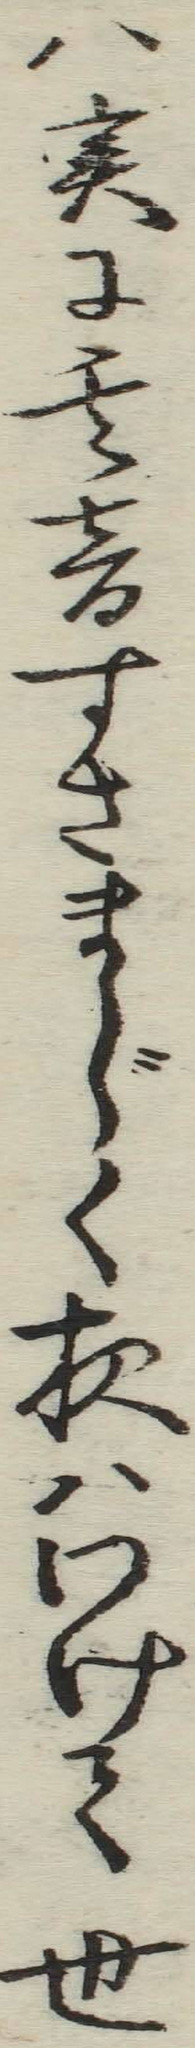は実に其音すさまじく夜はわけて世
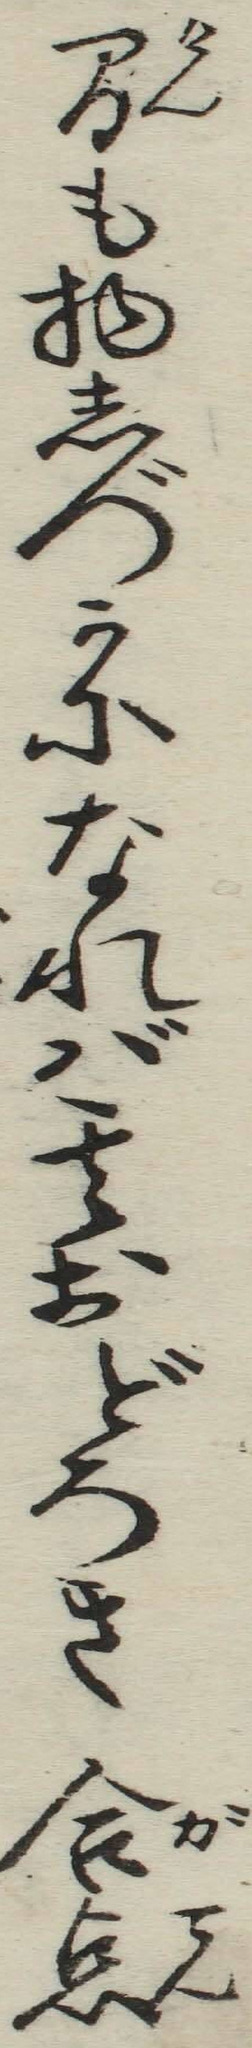間も物しづかになれば其おどろき合点
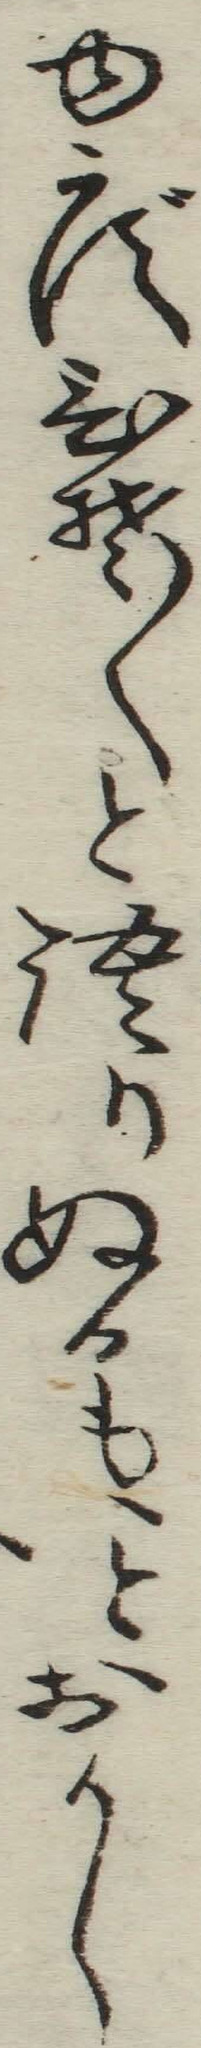ゆかずひそ〳〵と語りぬるもいとおかし

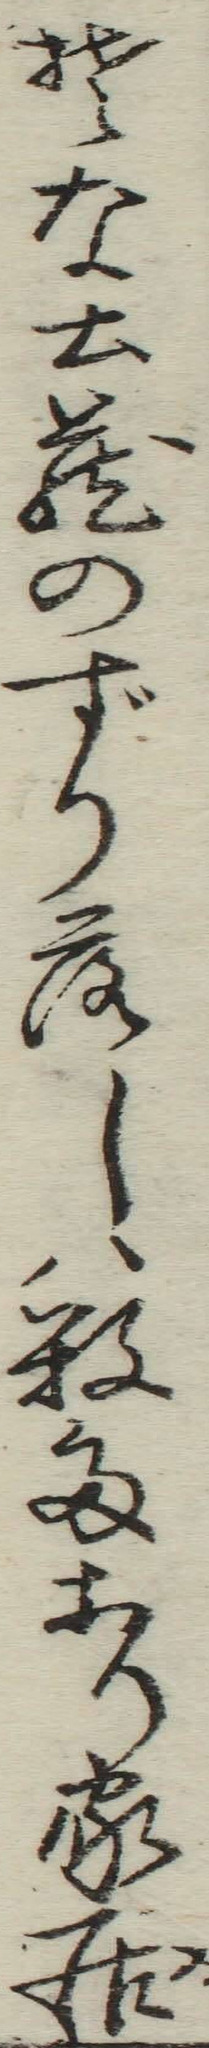そな土蔵のずり落しは数多あり家居
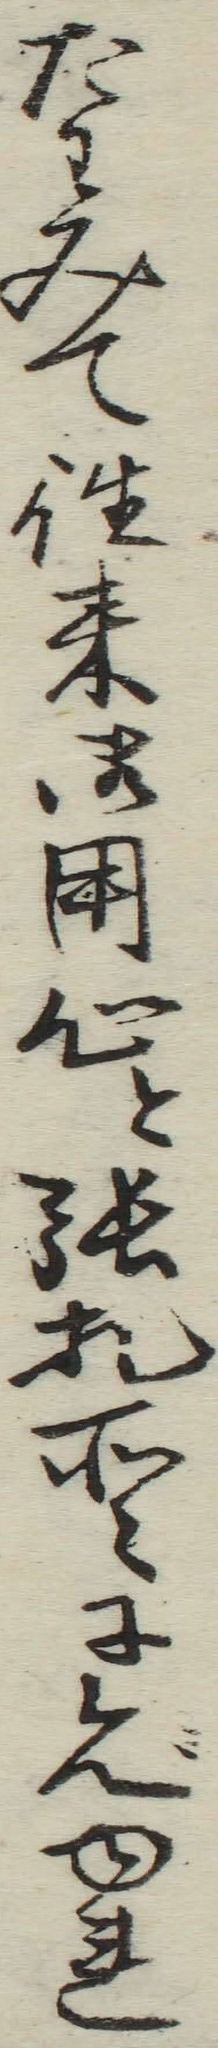たわみて往来御用心と張札所々に見ゆれ
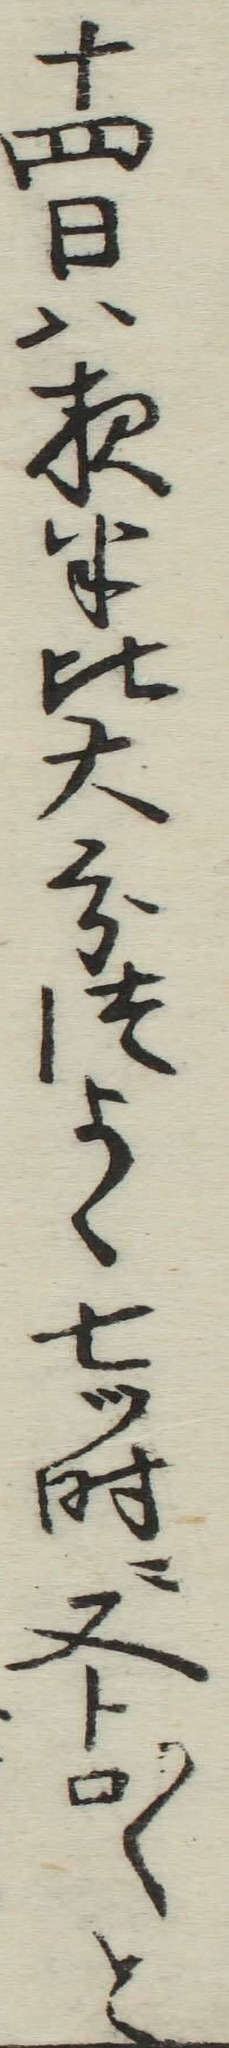十四日は夜半比大分つよく七ツ時に又トロ〳〵と
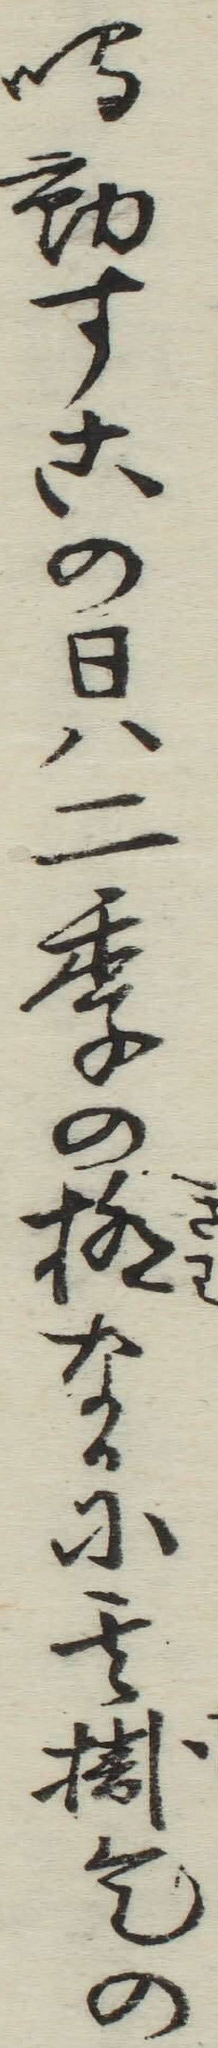鳴動すこの日は二季の極なるに其掛乞の
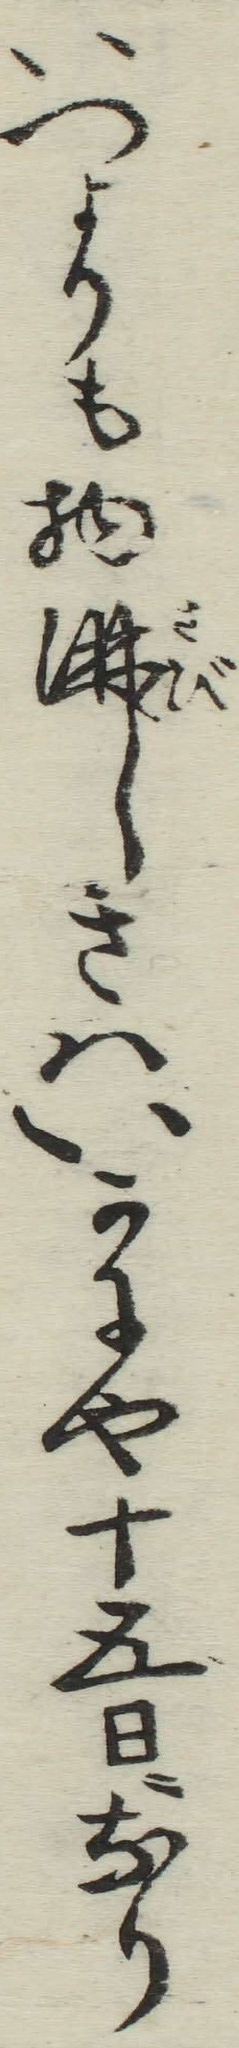いつよりも物淋しきはいかにや十五日になり
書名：地震奇談／平安万歳楽
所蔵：国文学研究資料館
